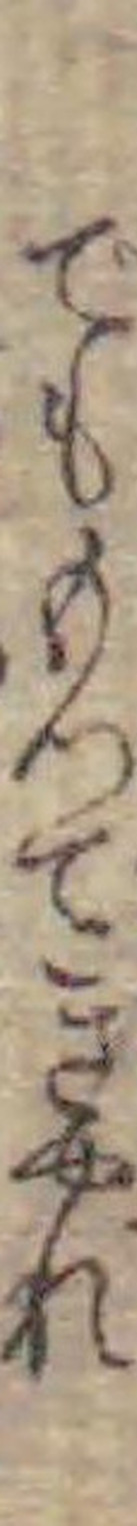でももつてきやれ
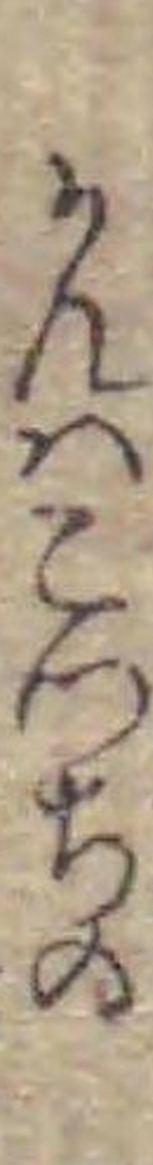かんはこつちの
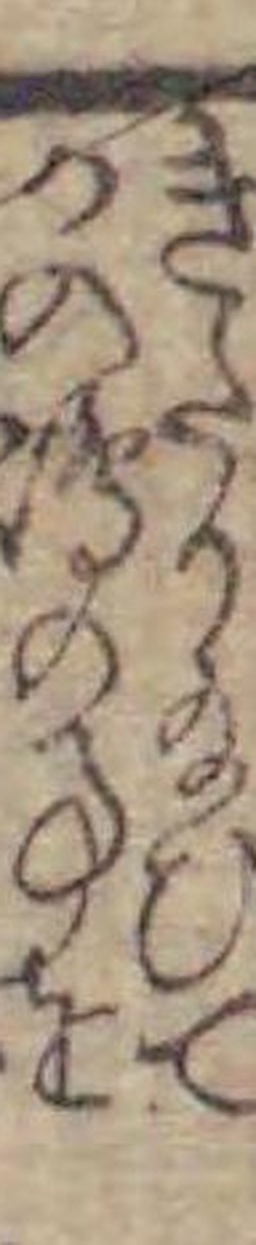かの島の事を
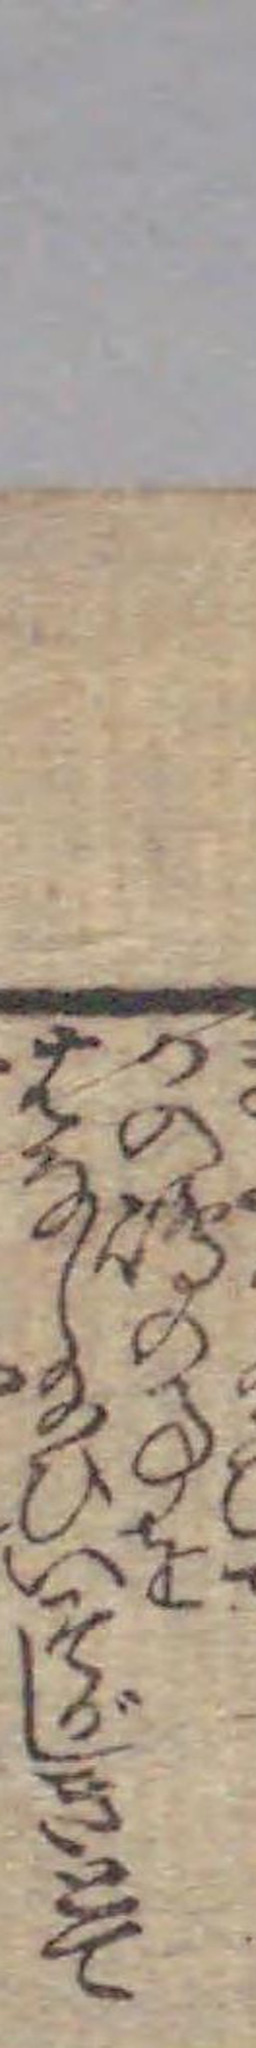はなし給ひいそがしきとて
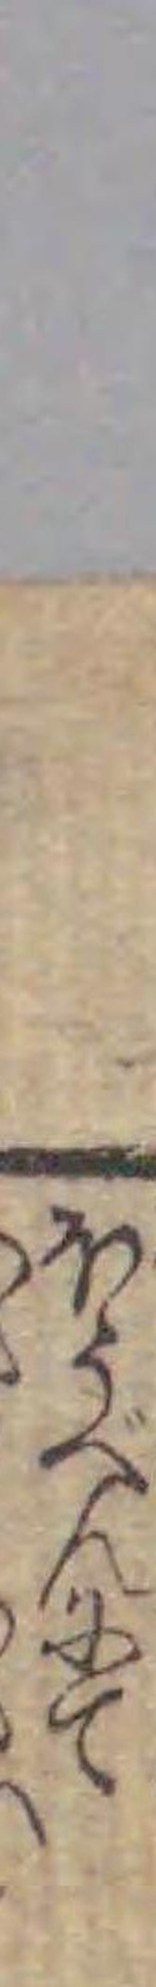ほうべんにて
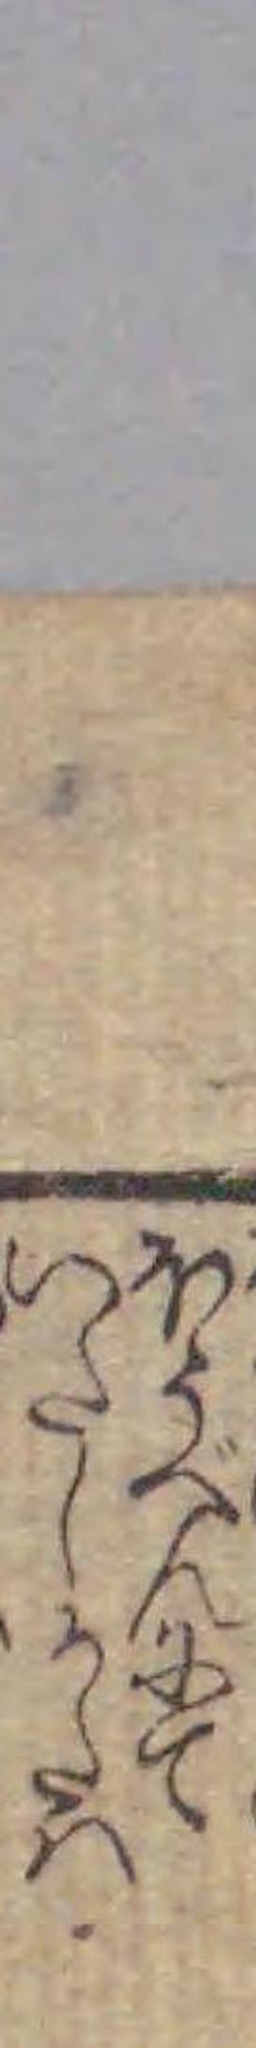いたしかたは
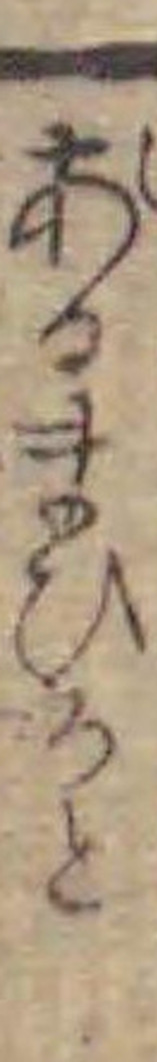あるまひかと

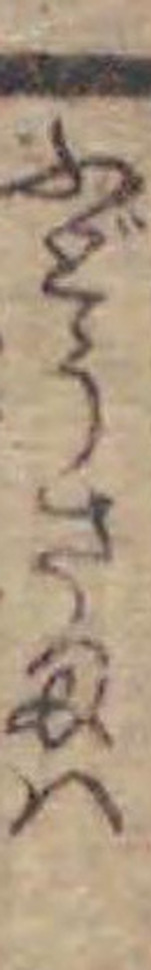ふどうさまは
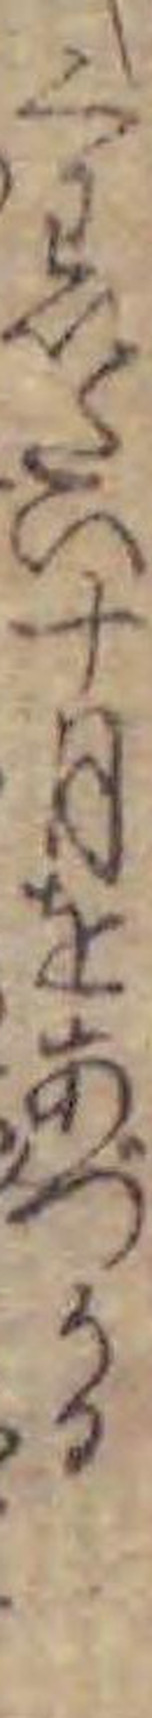〽くわいたい十月をあづかる
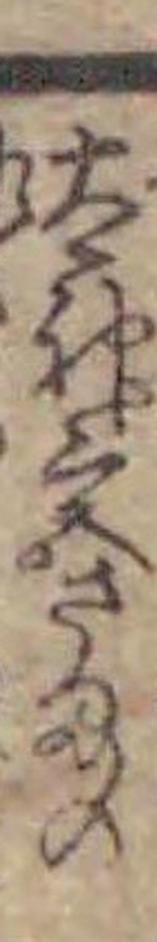太神宮さまの
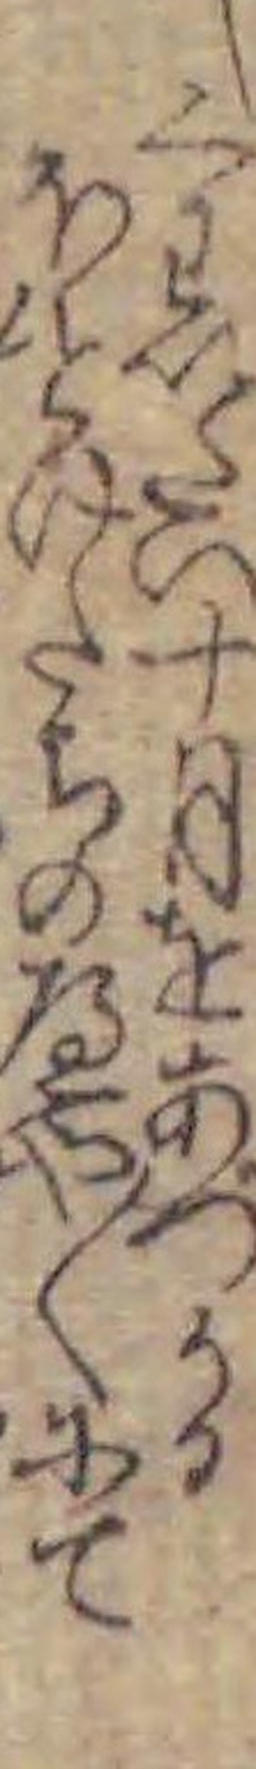ほとけたちのへや〳〵にて
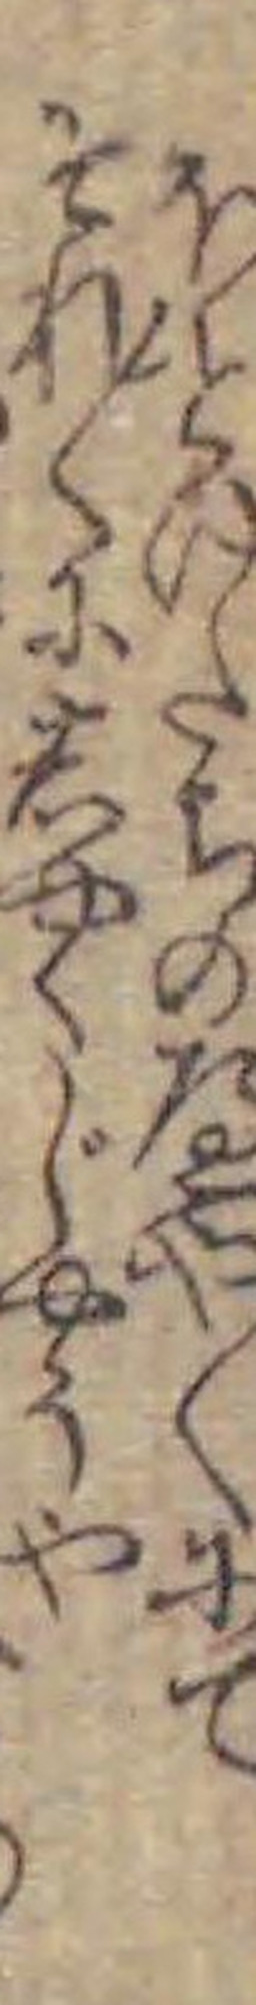それ〳〵にしやくじやうや
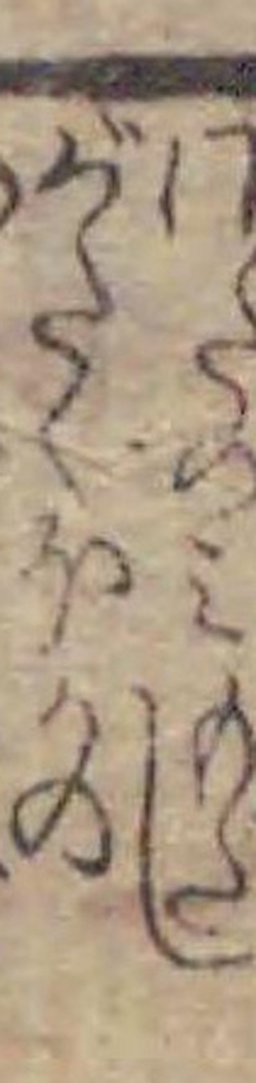がたくほかの
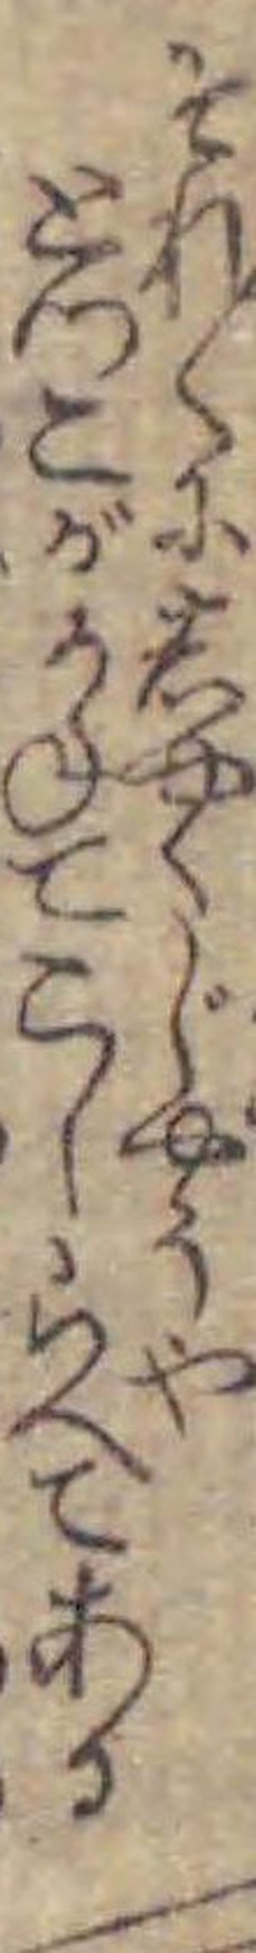とつこがかねてこしらへてある
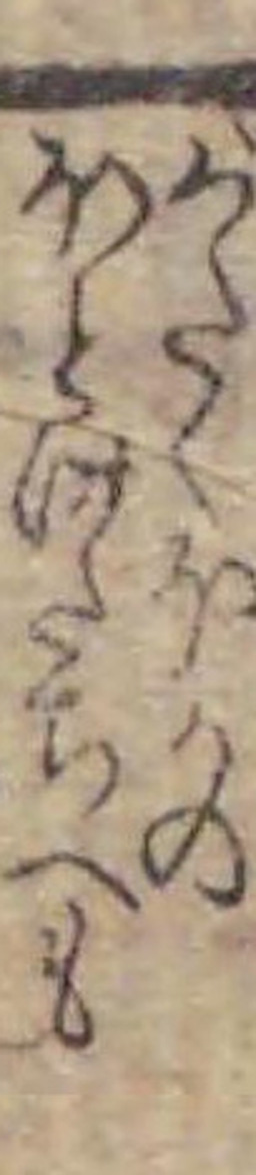ほとけたちへも
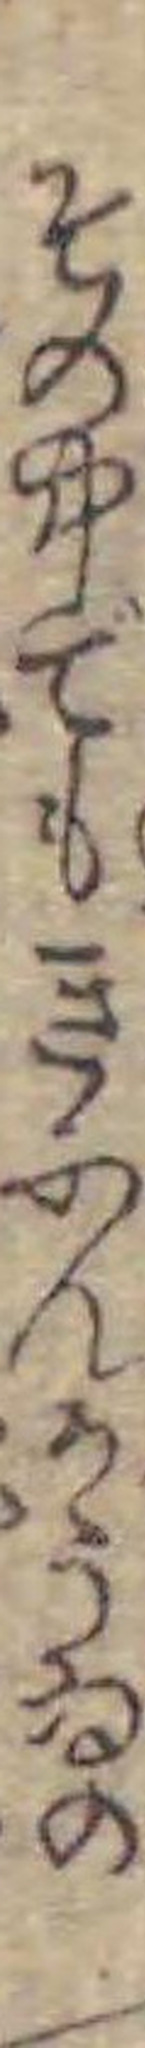その中でもきにんかうゐの
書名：奇妙頂礼胎錫杖 : 3巻
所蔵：国立国会図書館 National Diet Library, JAPAN
